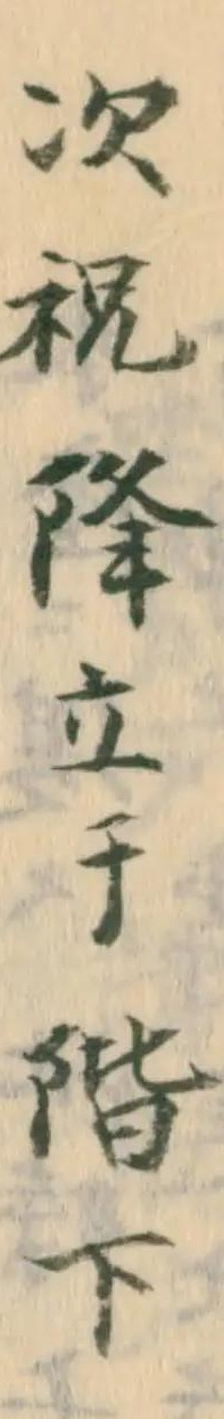次祝降立于階下
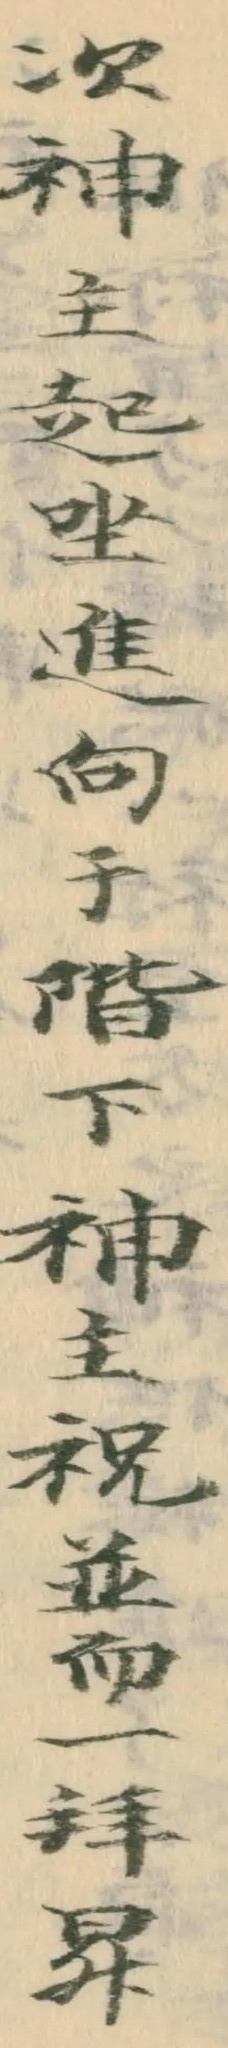次神主起坐進向于階下神主祝並而一拝昇
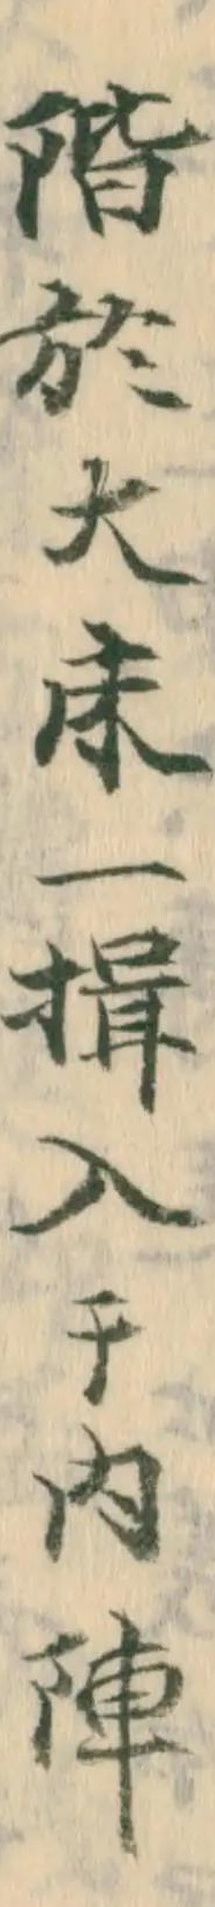階於大床一揖入于内陣
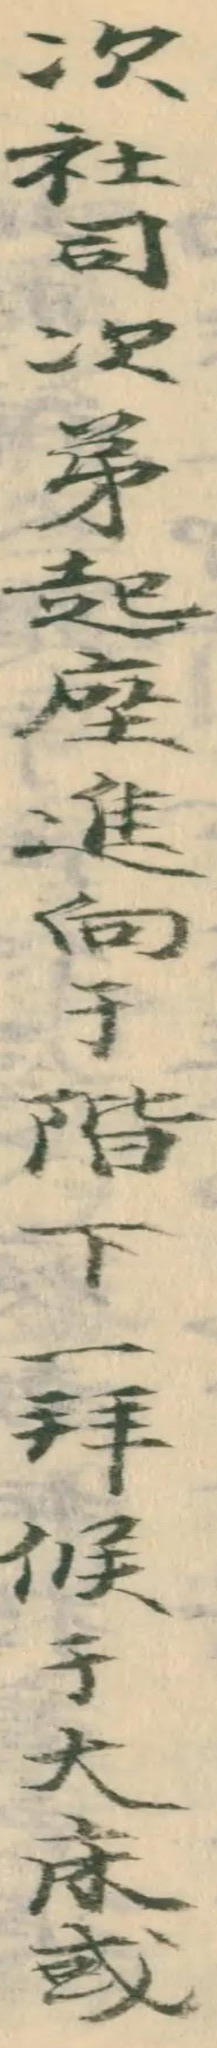次社司次第起座進向于階下一拝候于大床或
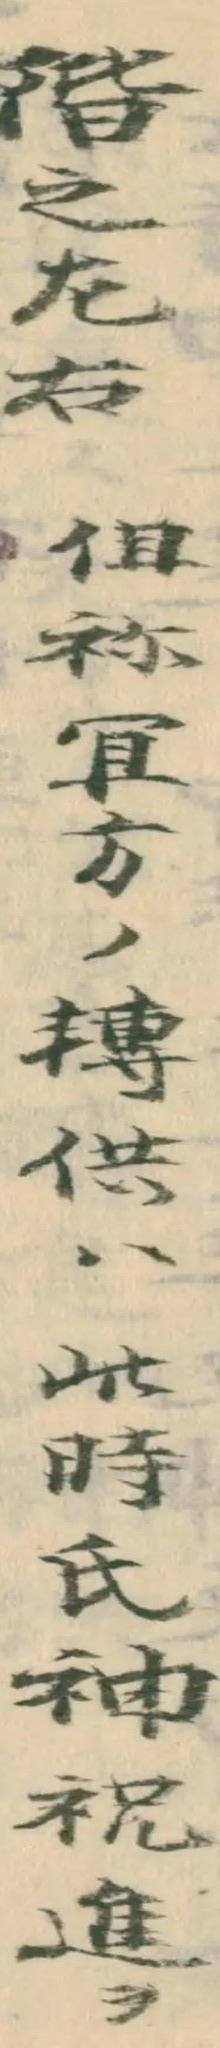階之左右但禰宜方ノ転供ハ此時氏神祝進ヲ
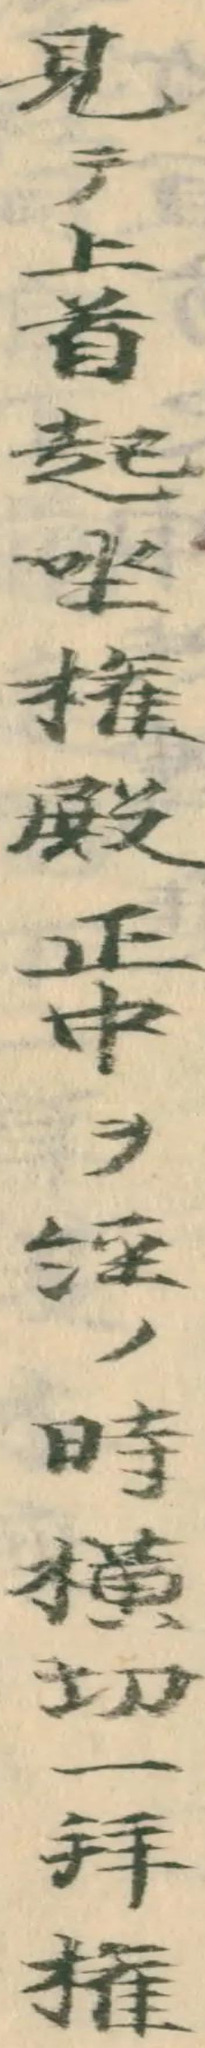見テ上首起坐権殿正中ヲ経ノ時横切一拝権
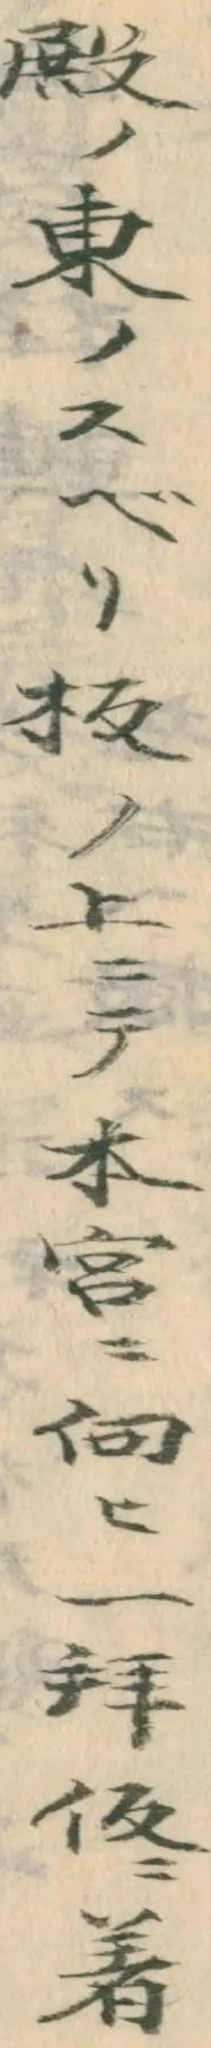殿ノ東ノスベリ板ノ上ニテ本宮ニ向ヒ一拝仮ニ着
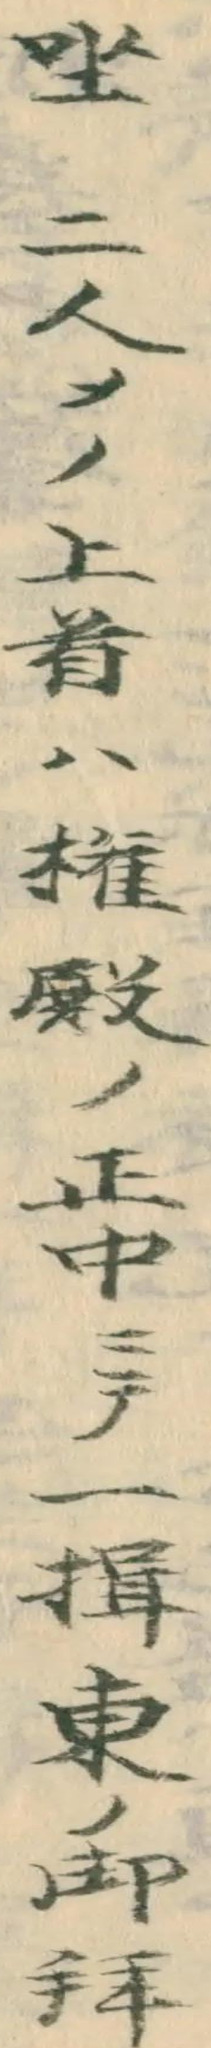坐二人メノ上首ハ権殿ノ正中ニテ一揖東ノ御拝
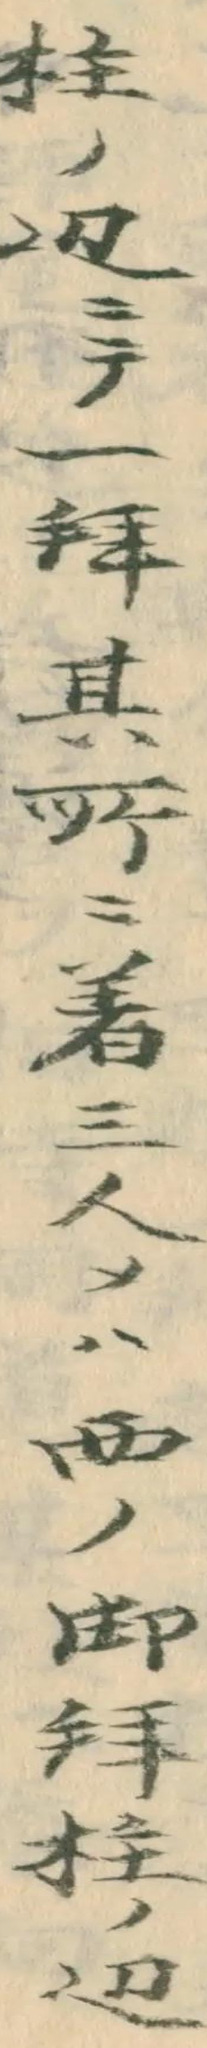柱ノ辺ニテ一拝其所ニ着三人メハ西ノ御拝柱ノ辺
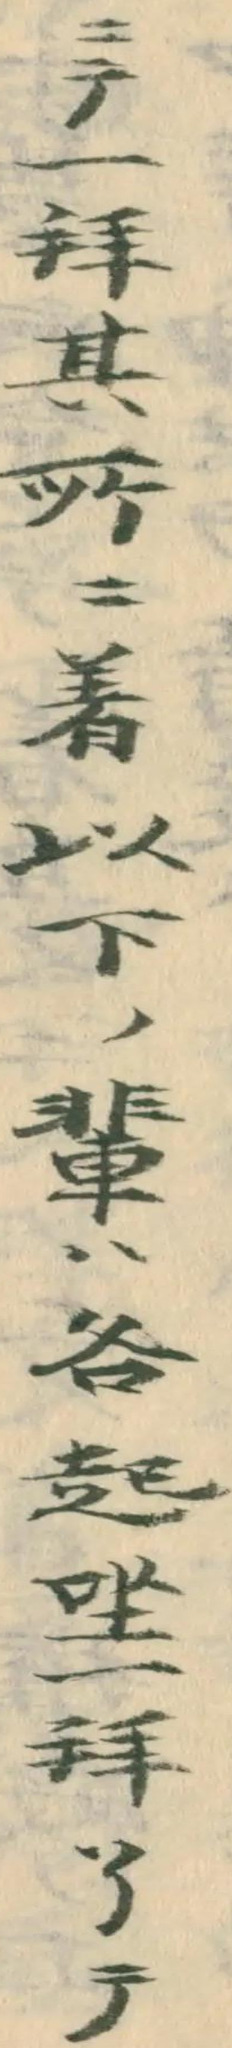ニテ一拝其所ニ着以下ノ輩ハ各起坐一拝了テ

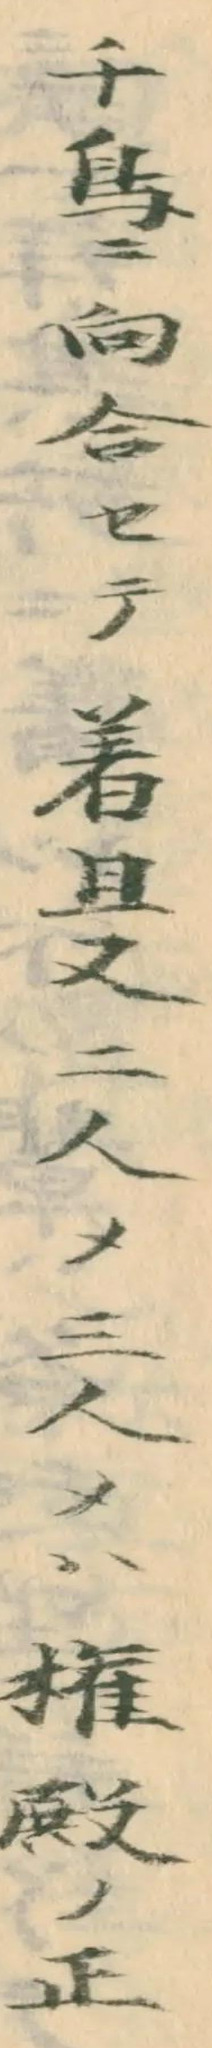千鳥ニ向合セテ着且又二人メ三人メハ権殿ノ正
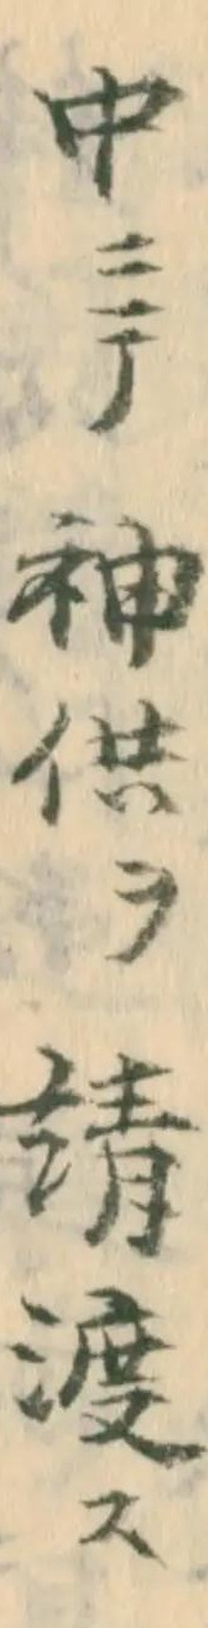中ニテ神供ヲ請渡ス
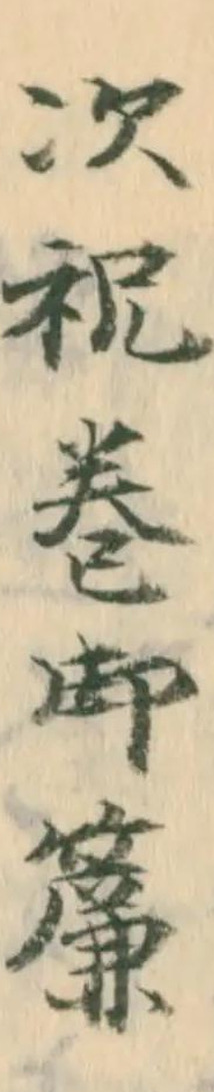次祝巻御簾
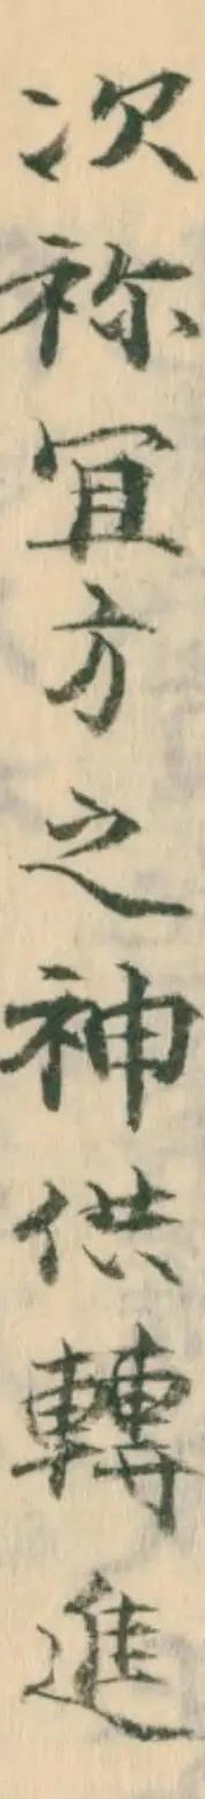次禰宜方之神供転進
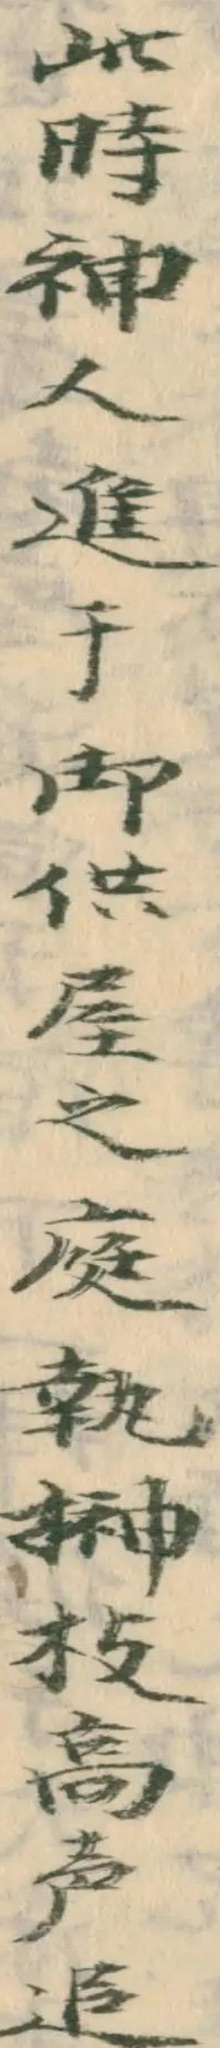此時神人進于御供屋之庭榊枝高声追
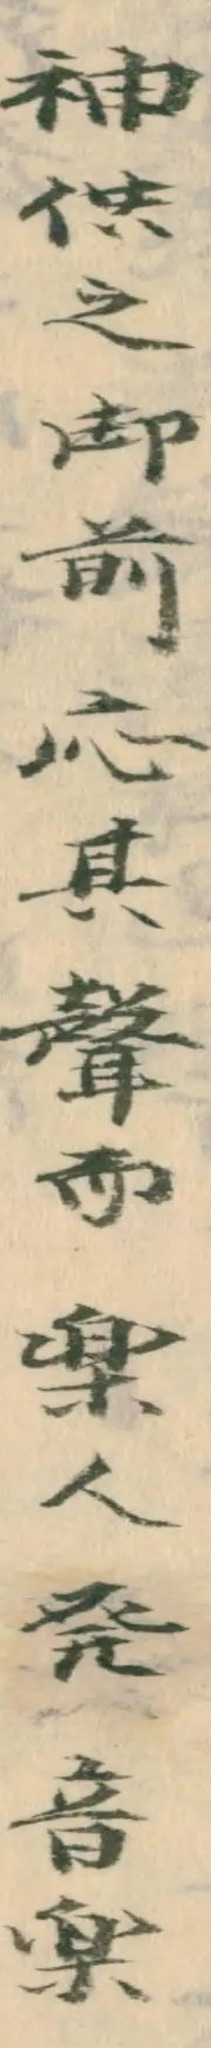神供之御前応其声而楽人発音楽
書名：賀茂社記録. 第5冊
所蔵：国立国会図書館 National Diet Library, JAPAN
